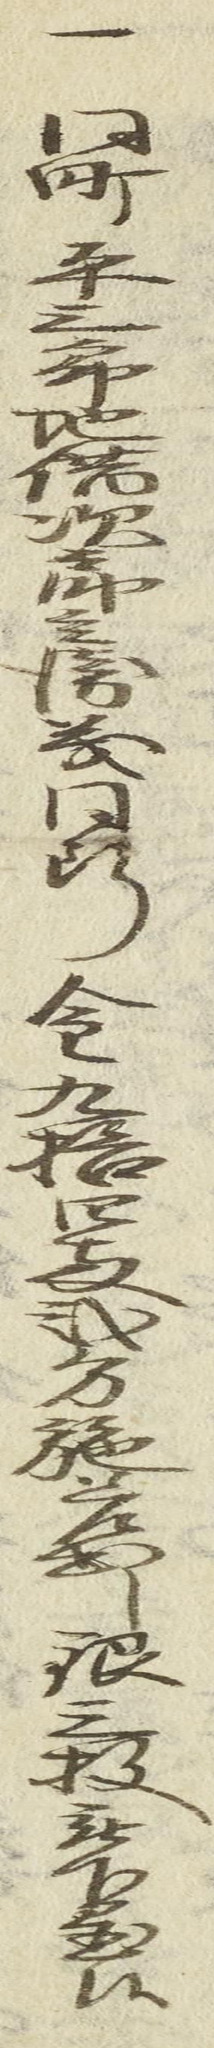一同町平三郎地借次郎兵衛義同断金九拾四両弐分施差出し銀三枚被下置候
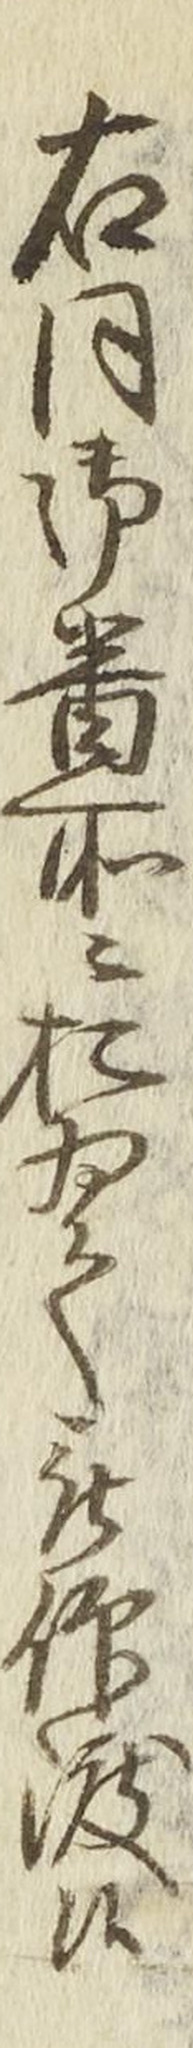右同御番所ニ於ゐて被仰渡候
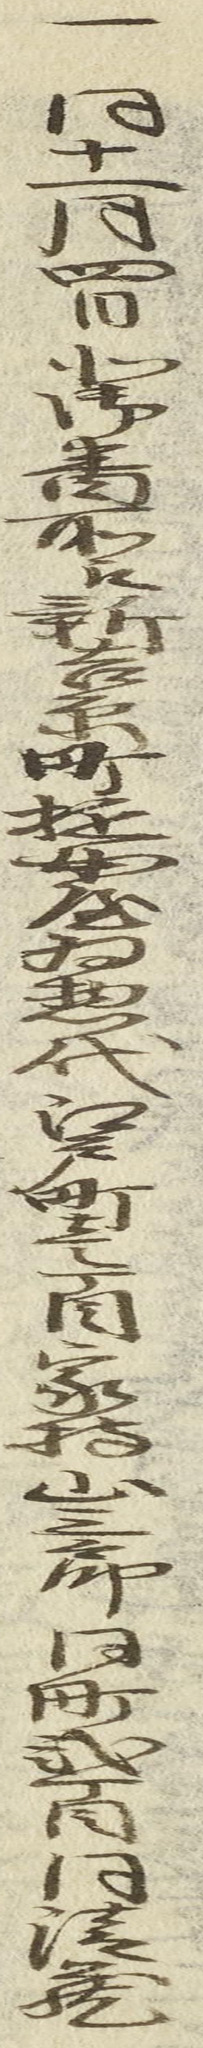一同十一月四日北御番所江新吉原町遊女屋為惣代江戸町壱丁目家持山三郎同町弐丁目同清蔵
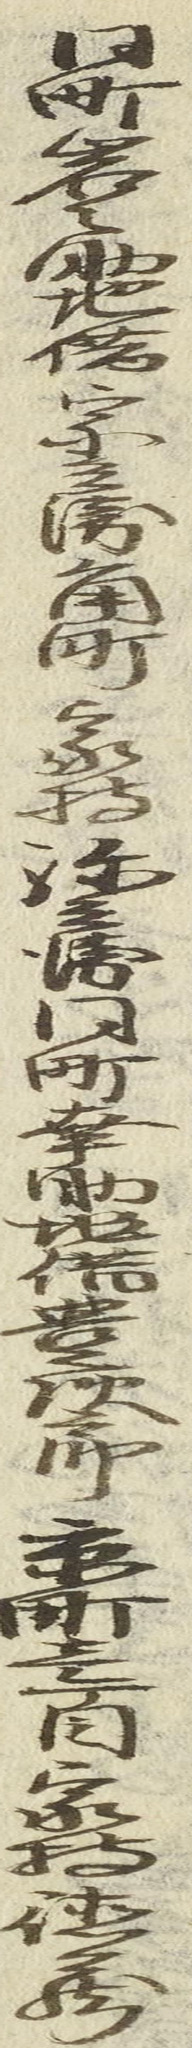同町岩之助地借宗兵衛角町家持弥兵衛同町幸助地借豊次郎京町壱丁目家持徳蔵
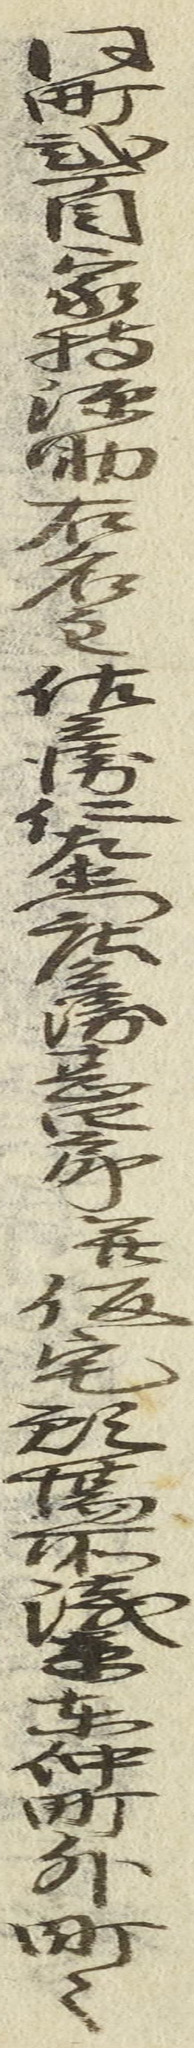同町弐丁目家持源助右名主佐兵衛仁左衛門庄兵衛甚四郎幷仮宅願場所浅草東仲町外町々
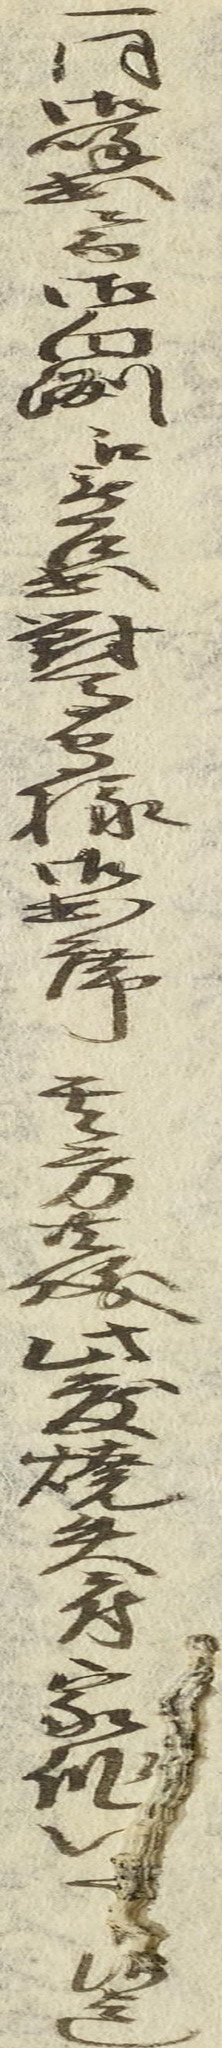一同御呼出ニ而御白洲江被召出対馬守様御出席其方共儀此度焼失ニ付家作いたし候迄
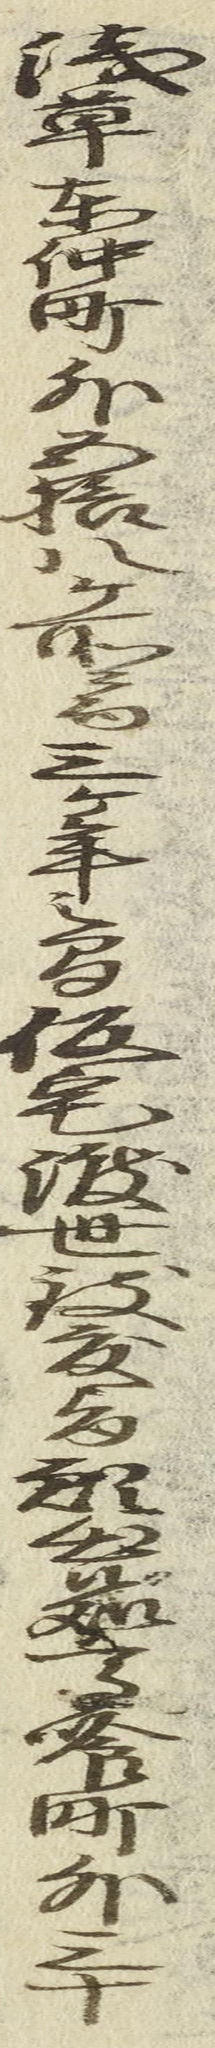浅草東仲町外五拾八ケ所ニ而三ケ年之間仮宅渡世致度旨願出候処馬喰町外三十
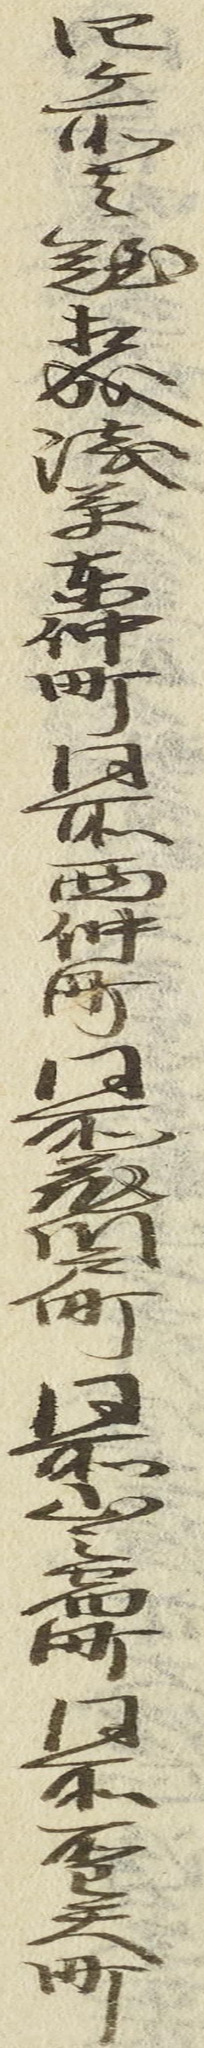四ケ所者難相成浅草東仲町同所西仲町同所花川戸町同所山之宿町同所聖天町
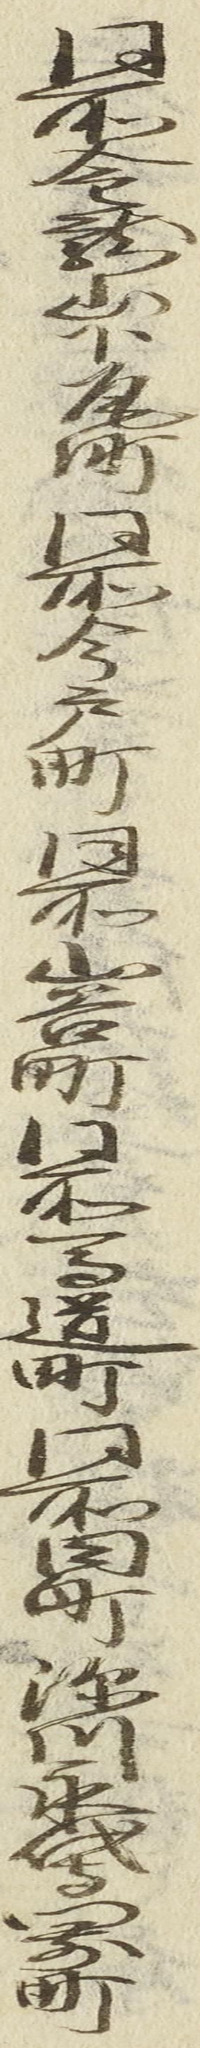同所金龍山下瓦町同所今戸町同所山谷町同所馬道町同所田町深川永代寺門前町
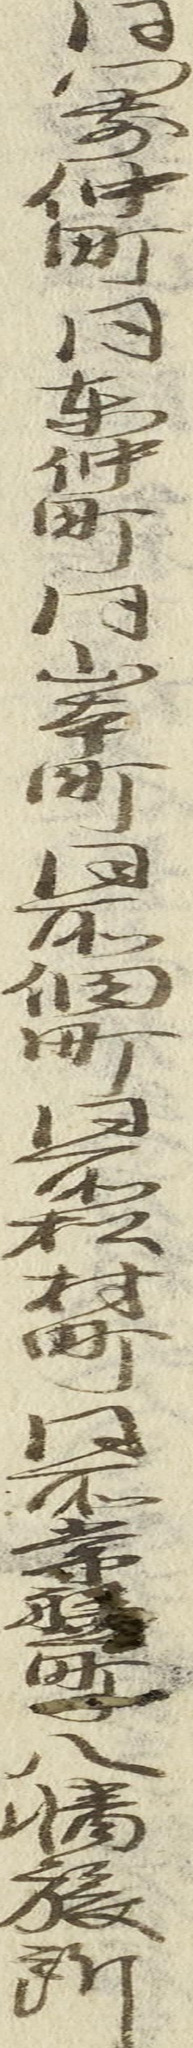同門前仲町同東仲町同山本町同所佃町同所松村町同所常盤町八幡旅所
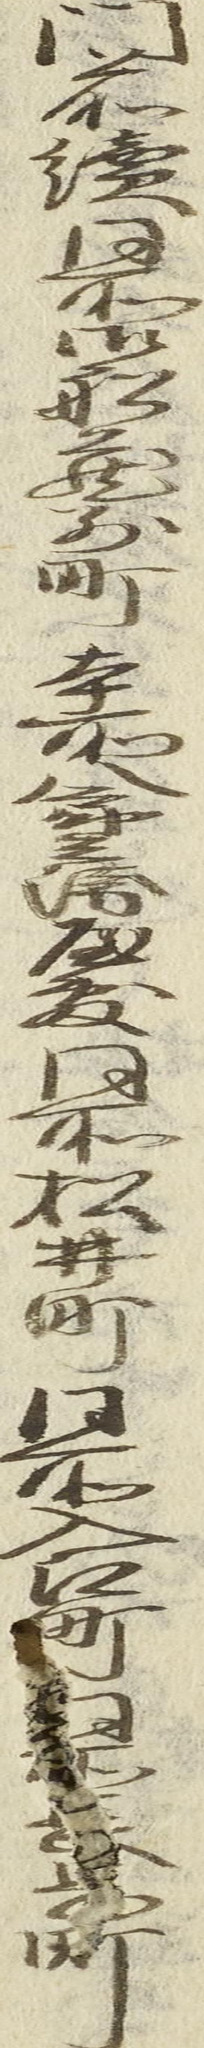門前続同所御船蔵前町本所八郎兵衛屋敷同所松井町同所入江町同所長岡町
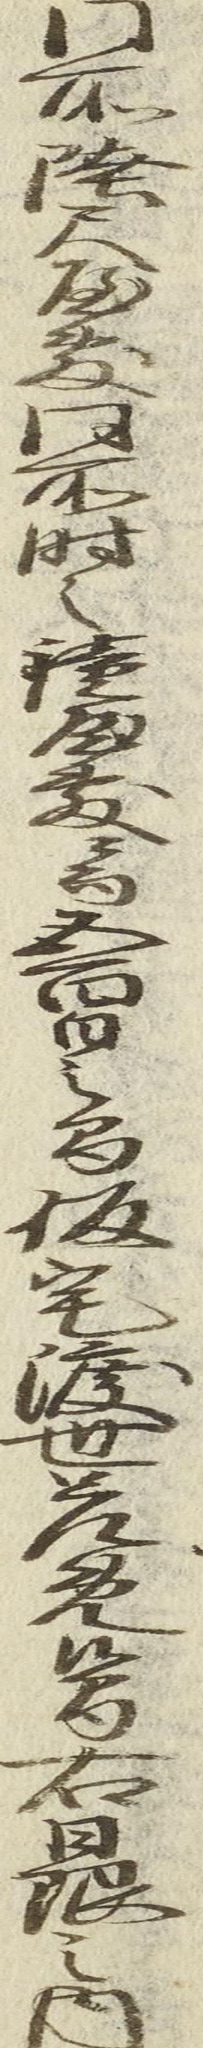同所陸尺屋敷同所時之鐘屋敷ニ而五百日之間仮宅渡世差免候間右日限之内
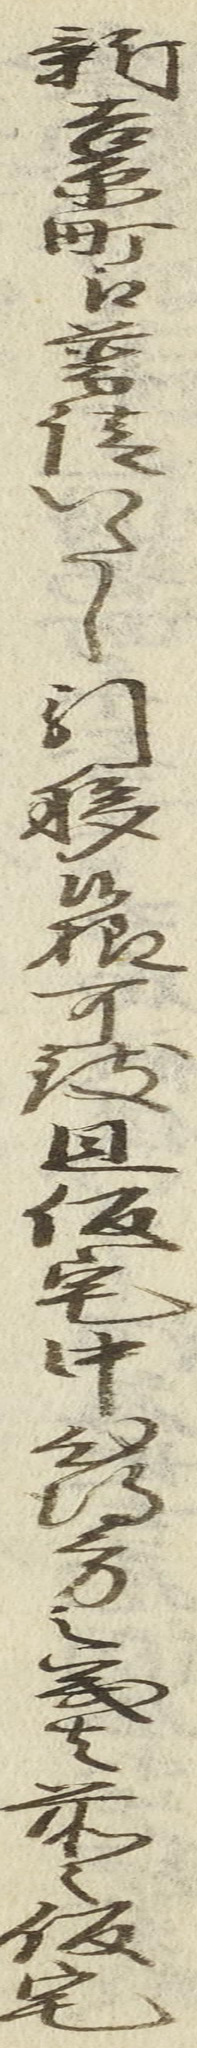新吉原町江普請いたし引移候様可致且仮宅中心得方之義者前々仮宅
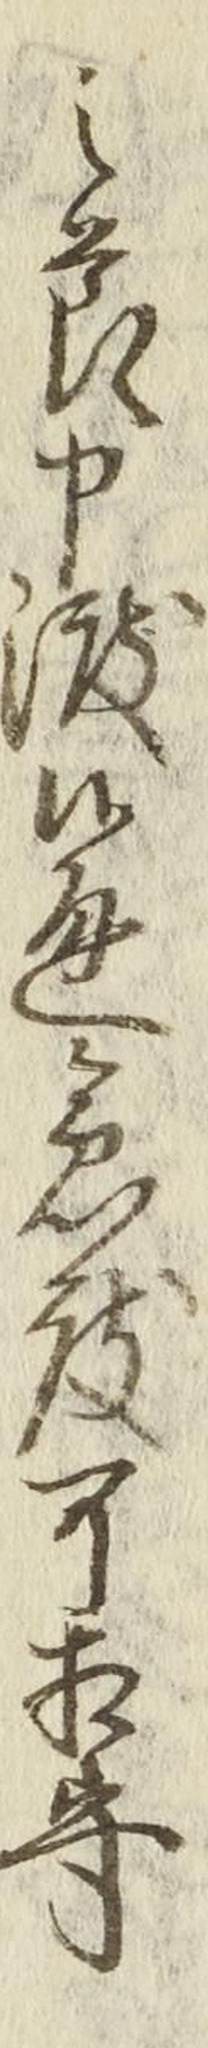之節申渡候通急度可相守
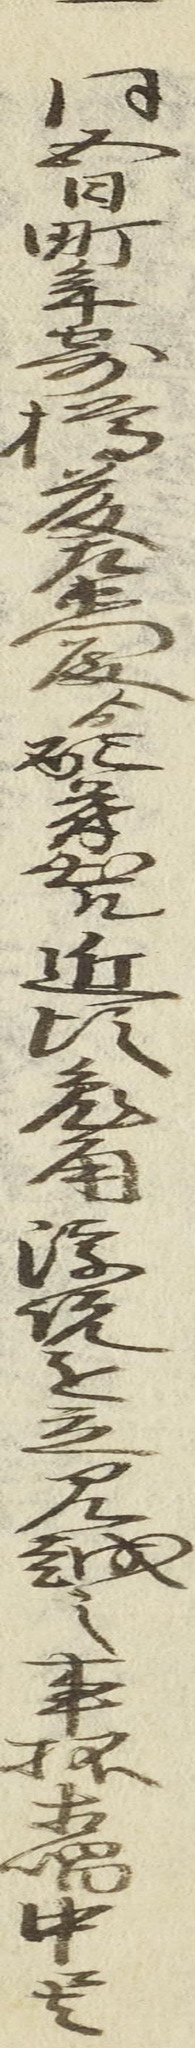一同五日町年寄樽藤左衛門殿ゟ配符出ル近頃兎角浮説を立見越之事抔相唱中ニ者
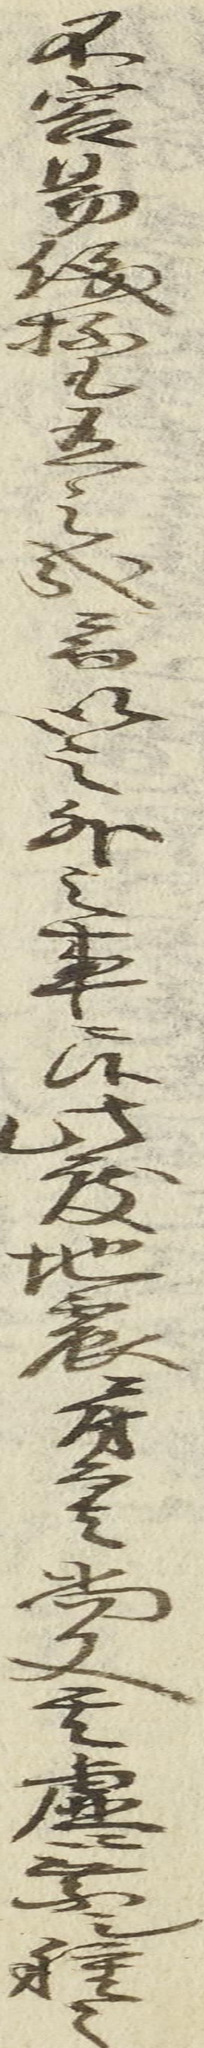不容易儀抔も有之哉ニ而以之外之事ニ候此度地震ニ付而者尚又其虚ニ乗シ種々
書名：安政二年震災記事　完
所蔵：東京大学地震研究所図書室 Earthquake Research Institute Library, The University of Tokyo, JAPAN
